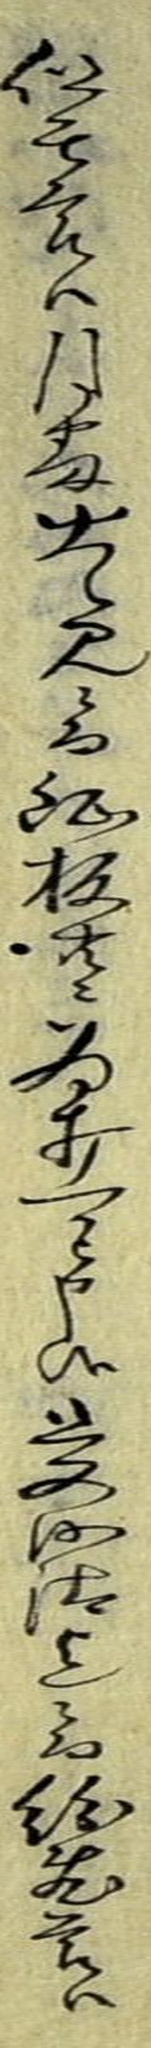但其節は月番火之見に而鉦板共に為打可被申候且又沙汰迄に而紛敷節は
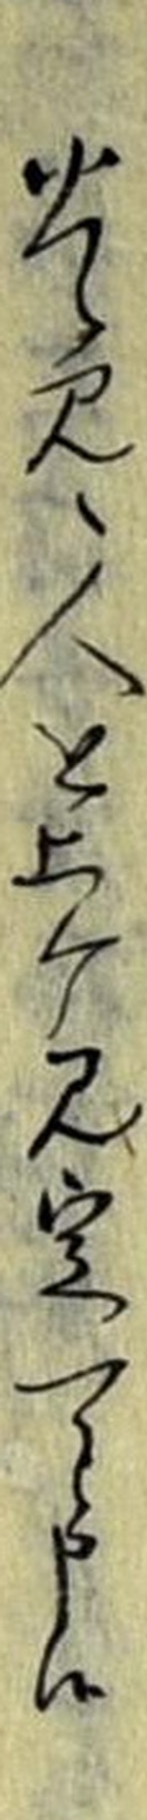火之見へ人を上ケ見定可被申候

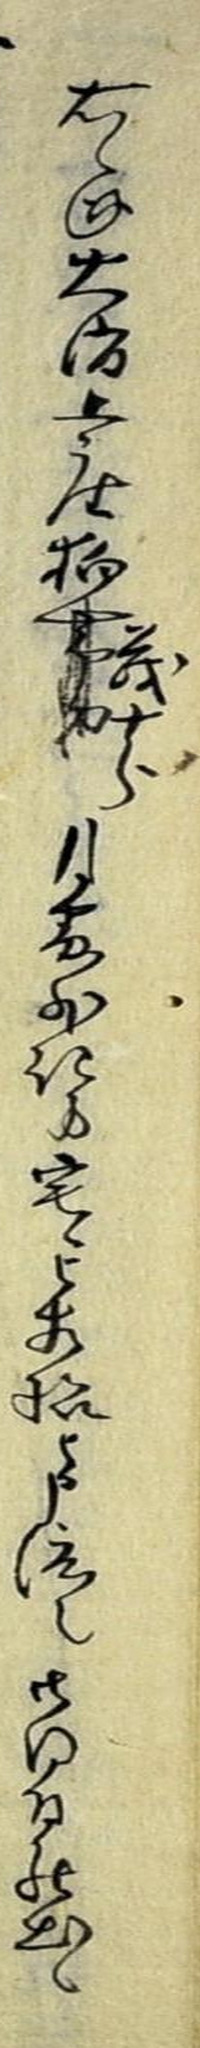右之趣火消上座狛茂十郎月番外記方宅へ被相招被申渡之御目付罷出候
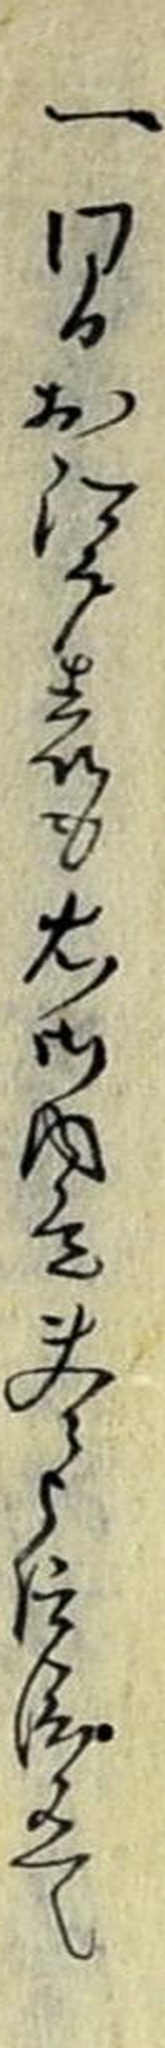一同日於江戸表も右御内意夫々被仰渡有之
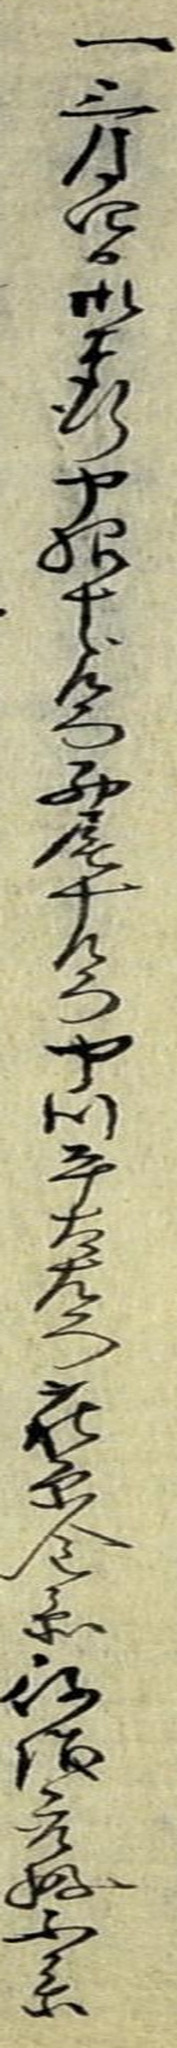一三月四日御奉行中根十郎左衛門西尾十左衛門中川平太左衛門萩原金兵衛役儀取扱不参
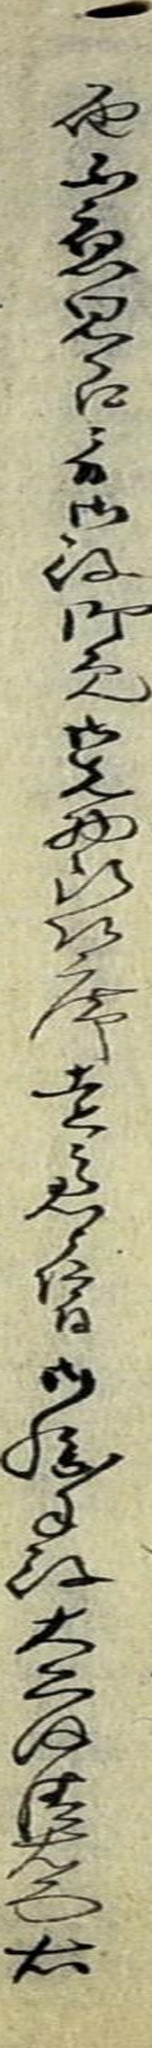届不応思召に付御役御免御先物頭次席遠慮被仰付御勝手役大久保清右衛門右
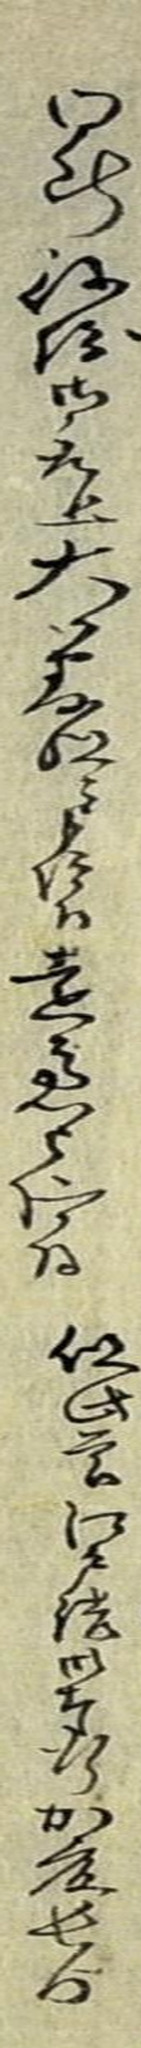同断役儀御取上大御番組に被仰付遠慮被仰付但此節江戸詰御奉行加藤長右衛門
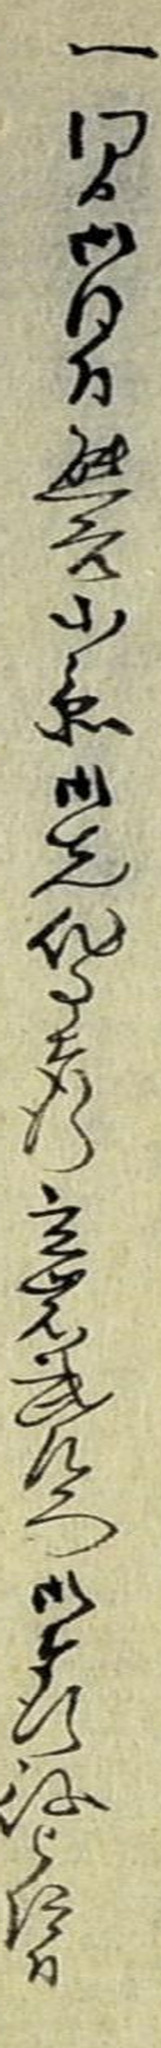一同日御目付熊谷小兵衛御先作事奉行立岩武左衛門御奉行役被仰付
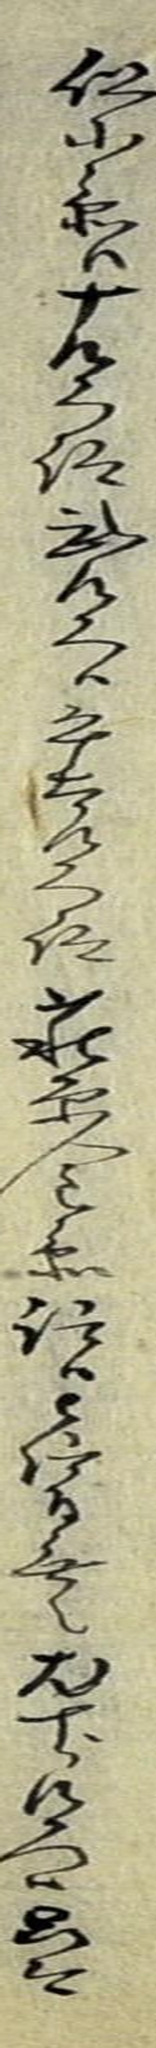但小兵衛は十左衛門跡武左衛門は平太左衛門跡萩原金兵衛跡は被仰付無之尤十郎左衛門は只今
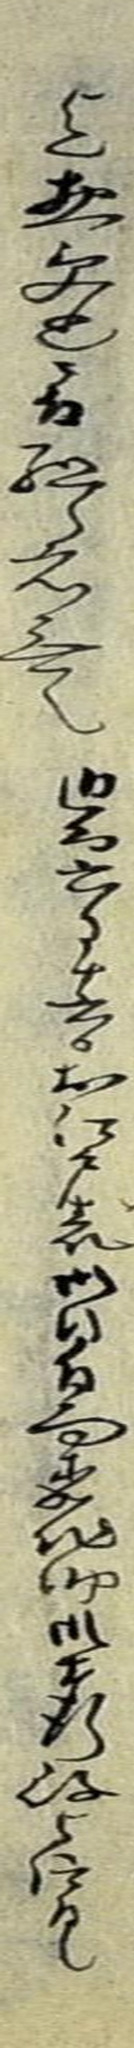迄惣受込に付組之者無之追而六月十六日於江戸表御目付雨森作助御奉行役被仰付之
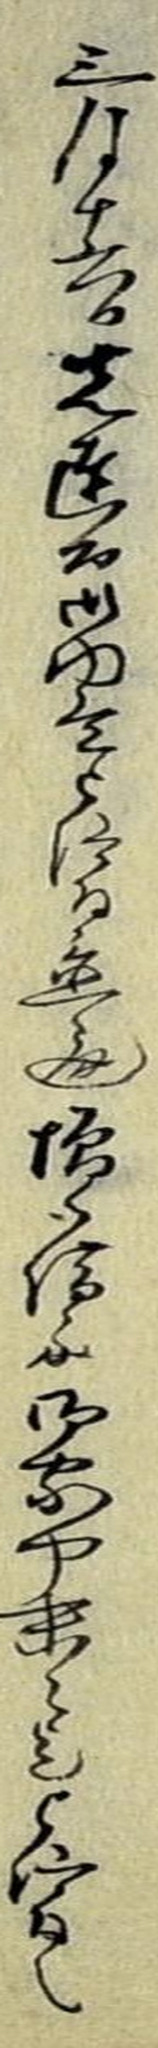三月十六日先達而御内意被仰付置候通増御借米御家中末々迄被仰付之
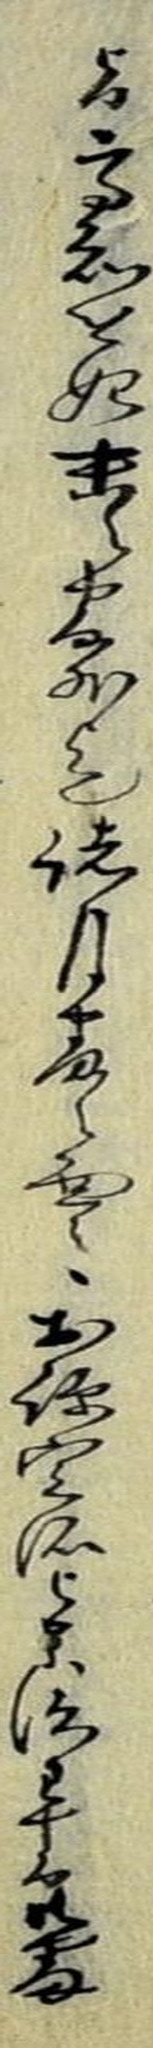旨高知を始末之番外迄諸月番之面々へ於評定所被申渡畢而御番
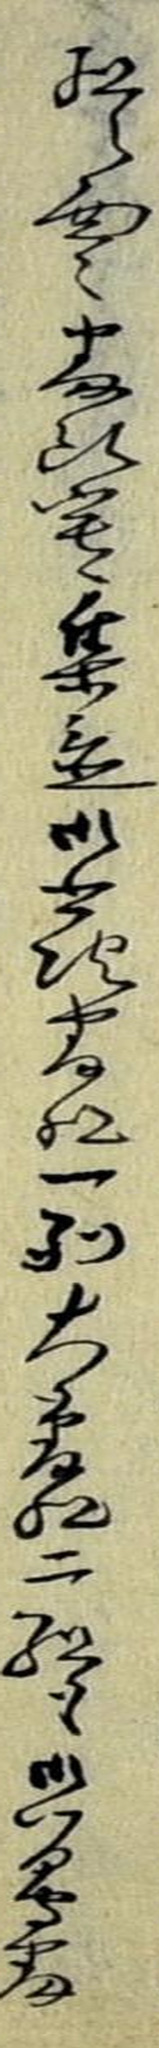組之面々番頭宅へ集置御書院番組一列大番組二組ツヽ御留守番
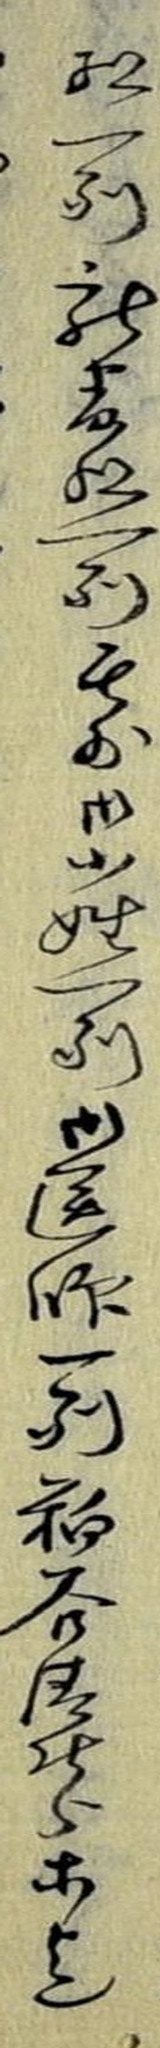組一列新番組一列其外御小姓一列御医師一列粕谷清次郎等迄
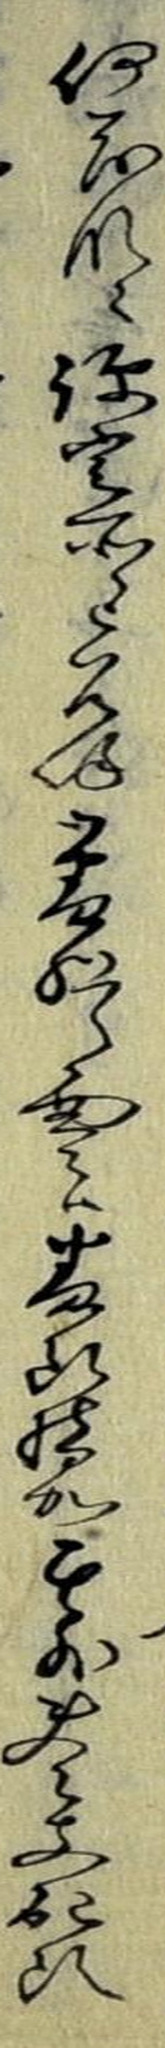何茂段々評定所へ被召呼御番組之面々は番頭指加其外夫々支配頭
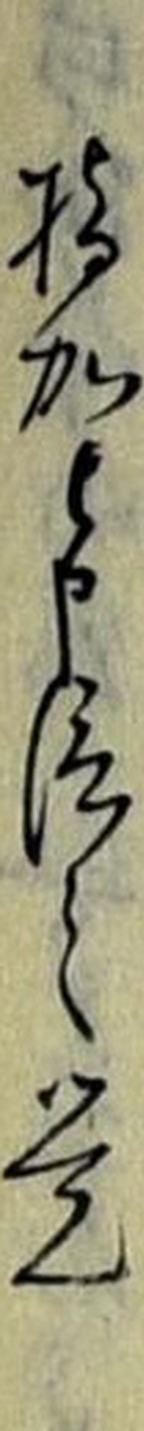指加被申渡之覚
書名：命令之部 二
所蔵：福井県文書館 Fukui Prefectural Archives
